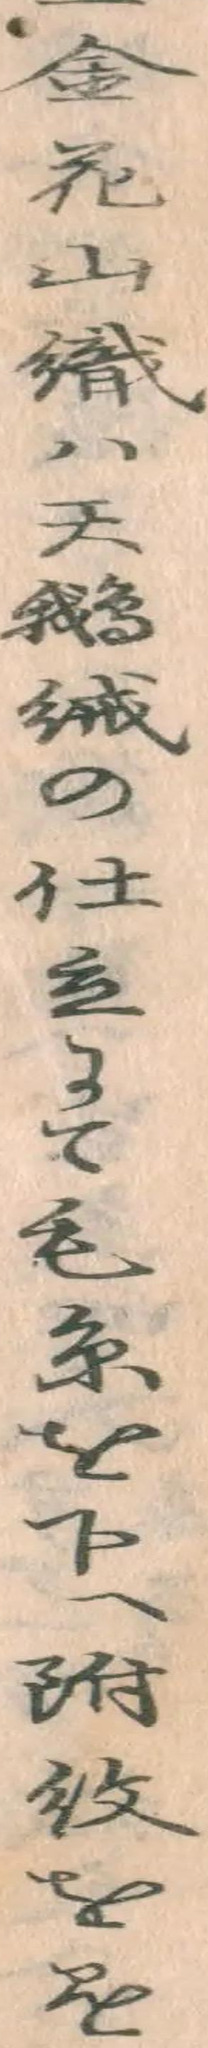一金花山織は天鵝絨の仕立にて毛糸を下へ附紋を懸
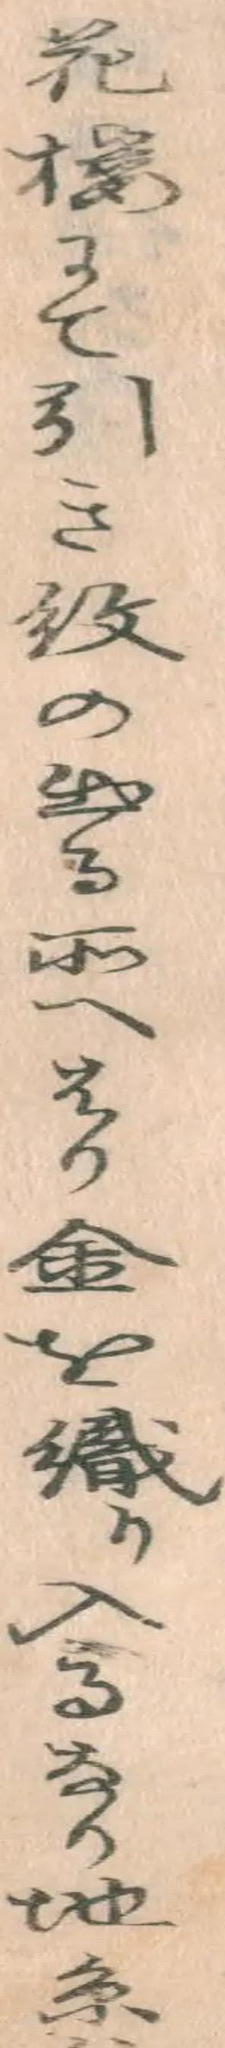花楼にて引き紋の出る所へはり金を織り入るなり地糸は
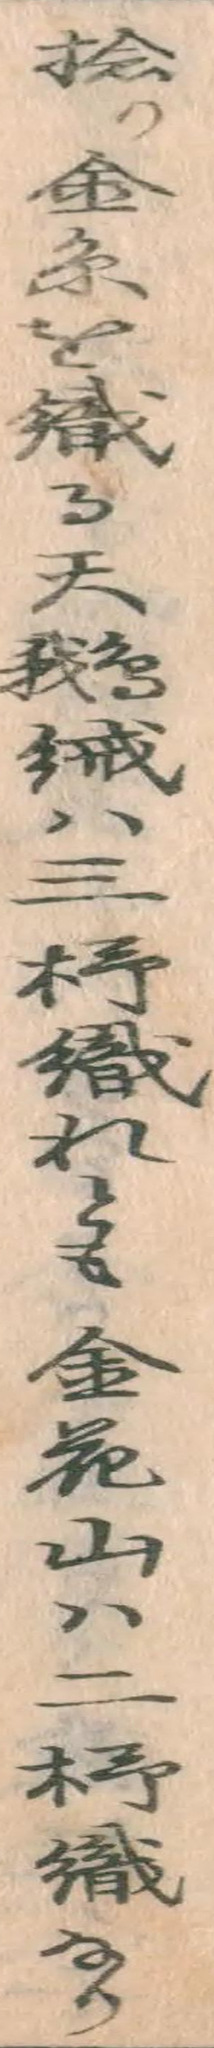捻り金糸を織る天鵝絨は三杼織れとも金花山は二杼織なり
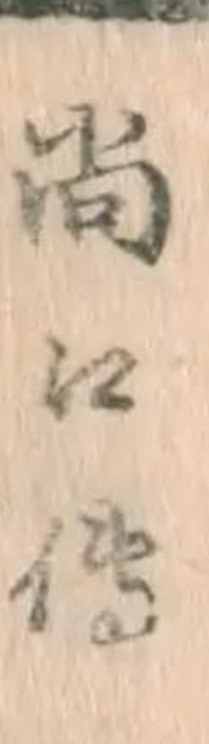尚口伝

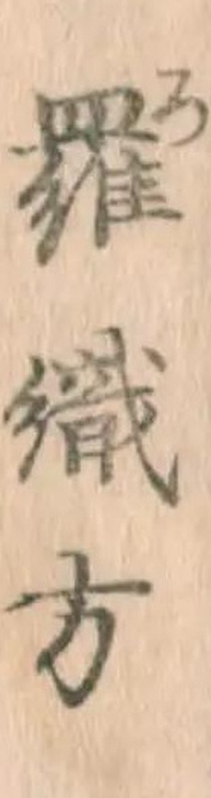羅織方
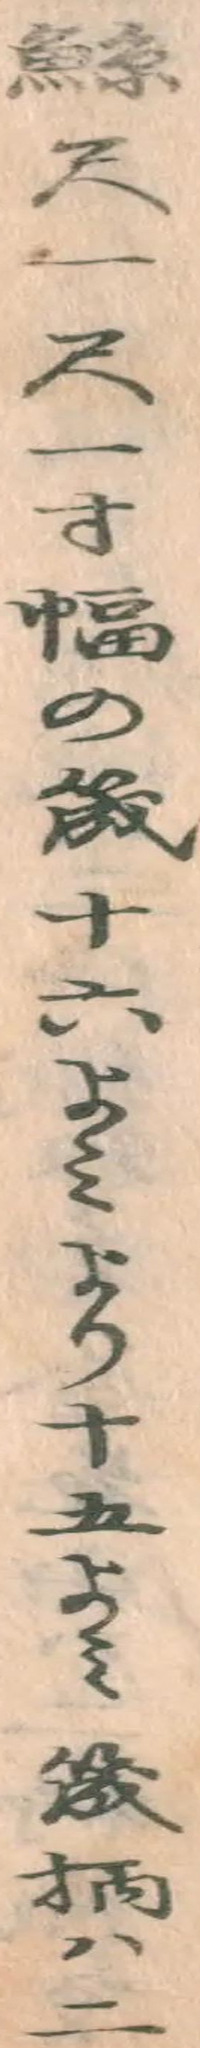一鯨尺一尺一寸幅の筬十六よみより十五よみ筬柄は二
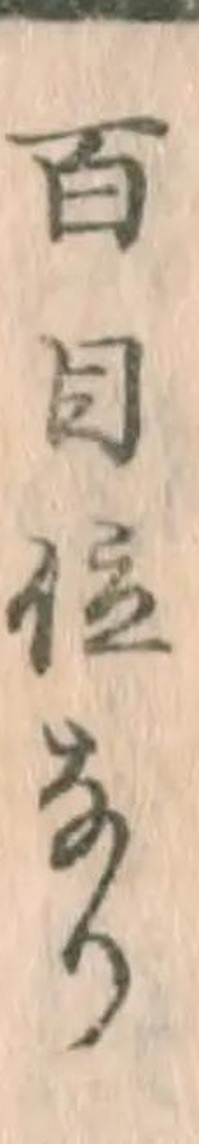百目位なり
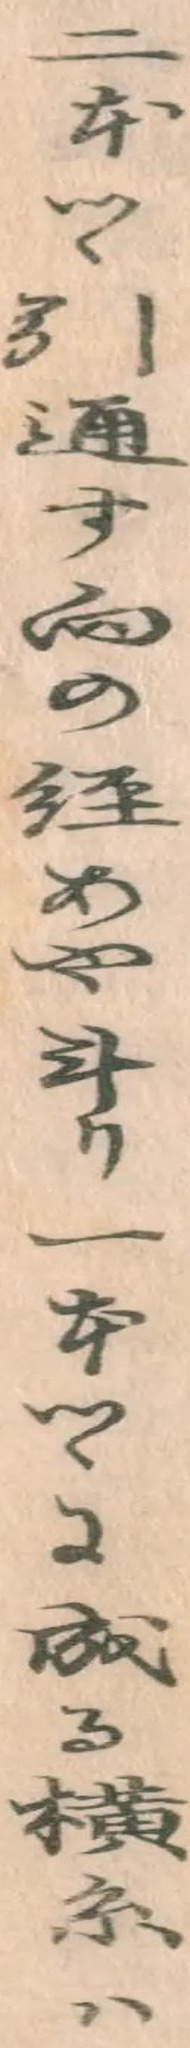二本つゝ引通す向の経あや斗り一本つゝに成る横糸は
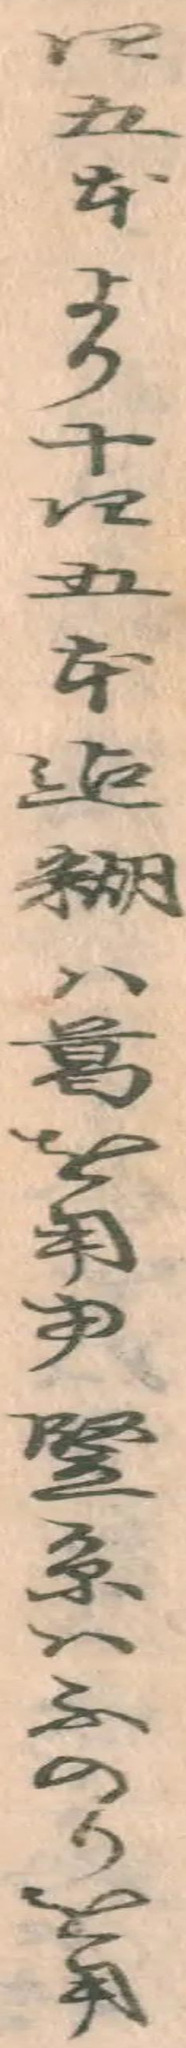四五本より十四五本迄糊は葛を用ゆ竪糸はふのりを用
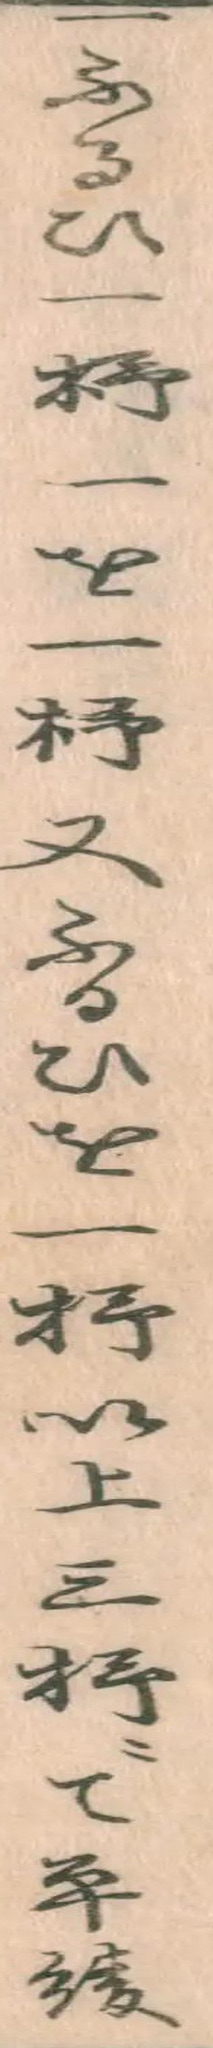一ふるひ一杼一を一杼又ふるひを一杼以上三杼にて平綾
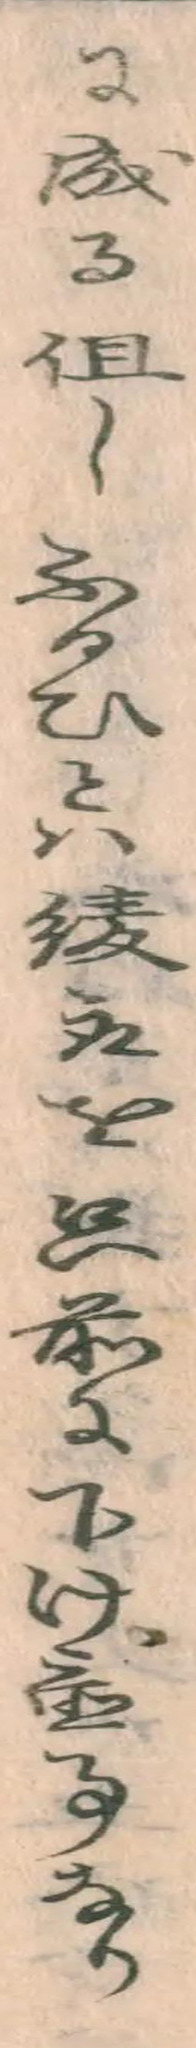に成る但しふるひとは綾取を只前に下け置事なり
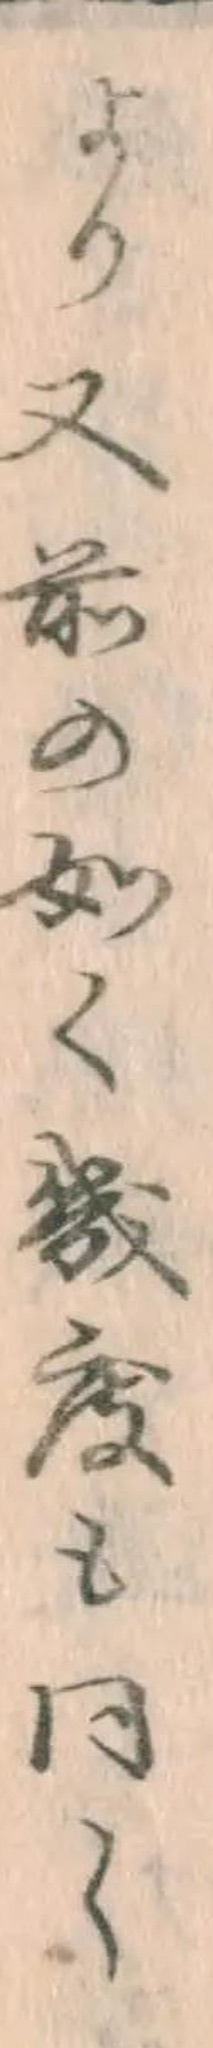より又前の如く幾度も同し
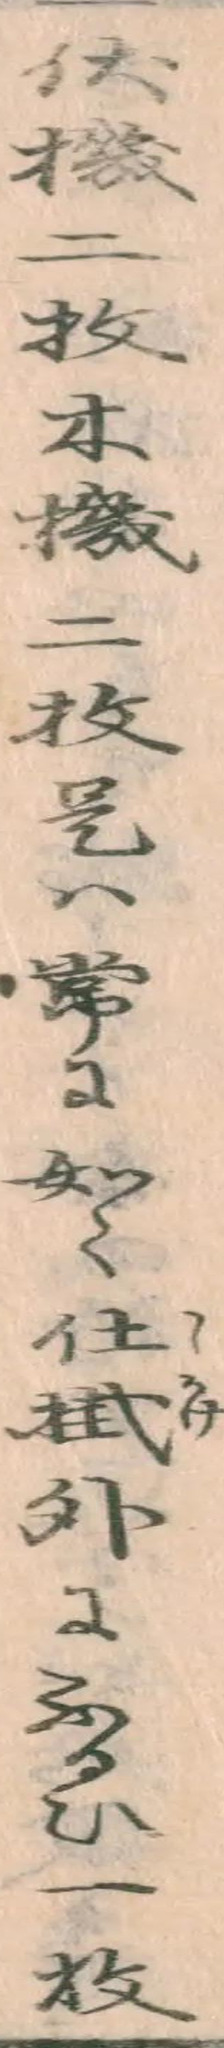一伏機二枚木機二枚是は常に如く仕掛外にふるひ一枚
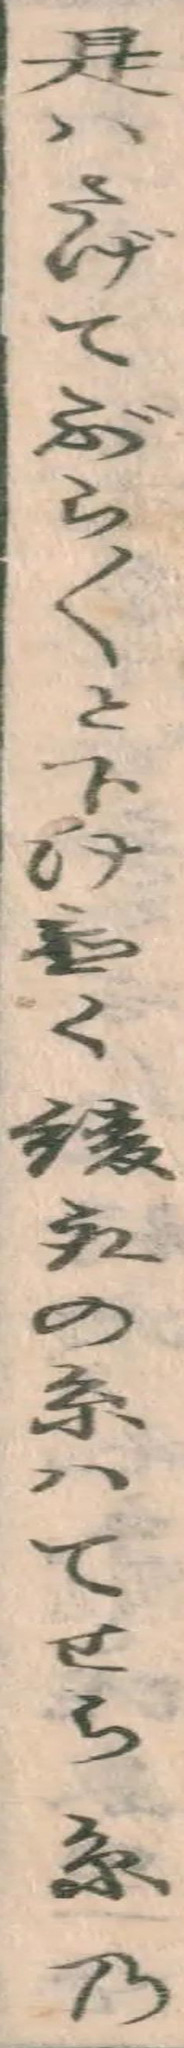是はさげてぶら〳〵と下け置く綾取の糸はてせら糸の
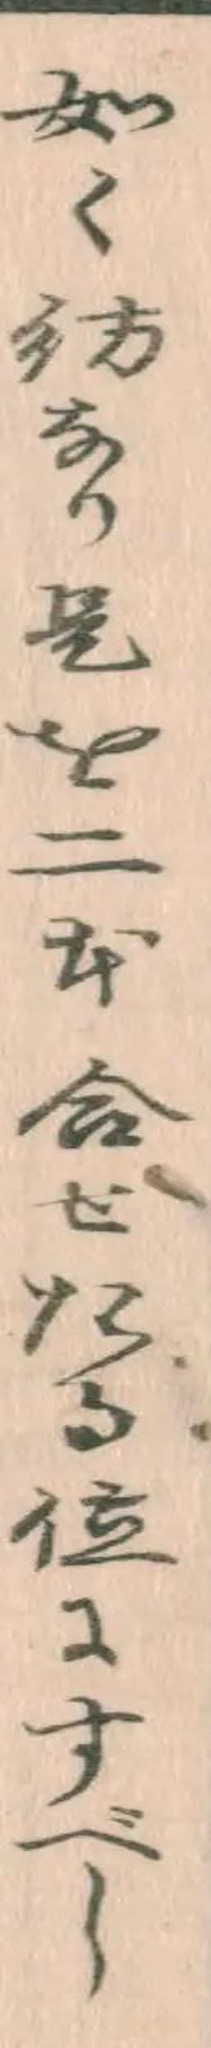如く紡なり是を二本合せたる位にすべし
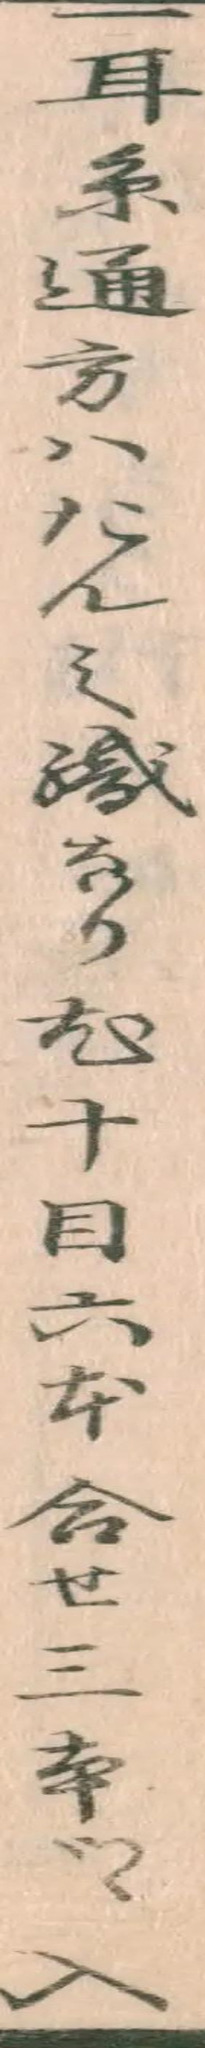一耳糸通方はたん之織なり尤十目六本合せ三本つゝ入
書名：機織彙編 5巻. [2]
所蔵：国立国会図書館 National Diet Library, JAPAN
